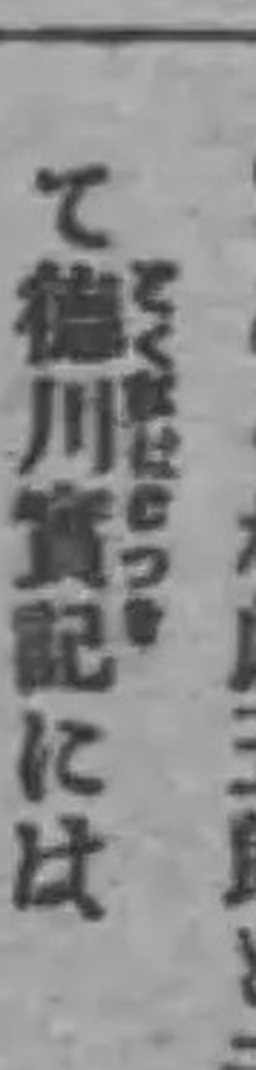て徳川実記には
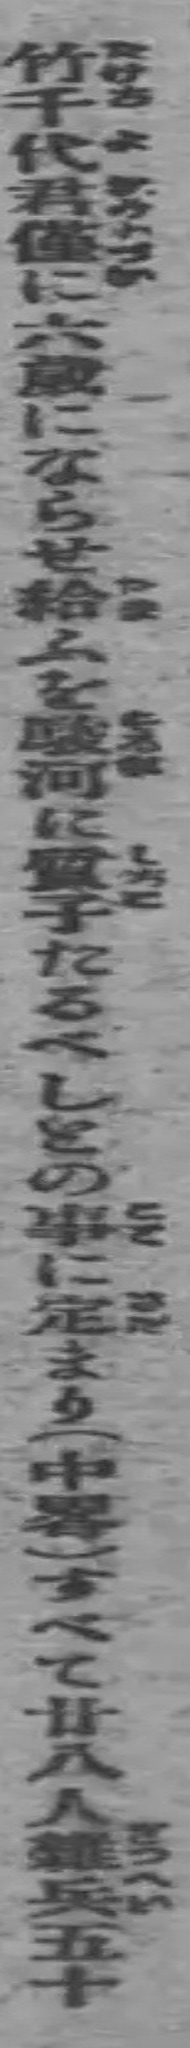竹千代君僅に六歳にならせ給ふを駿河に質子たるべしとの事に定まり(中略)すべて廿八人雑兵五十
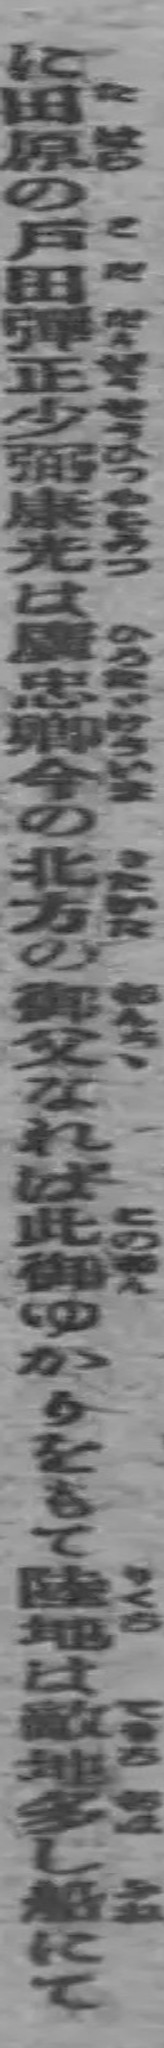に田原の戸田弾正少弼康光は広忠卿今の北方の御父なれば此御ゆかりをもて陸地は敵地多し船にて
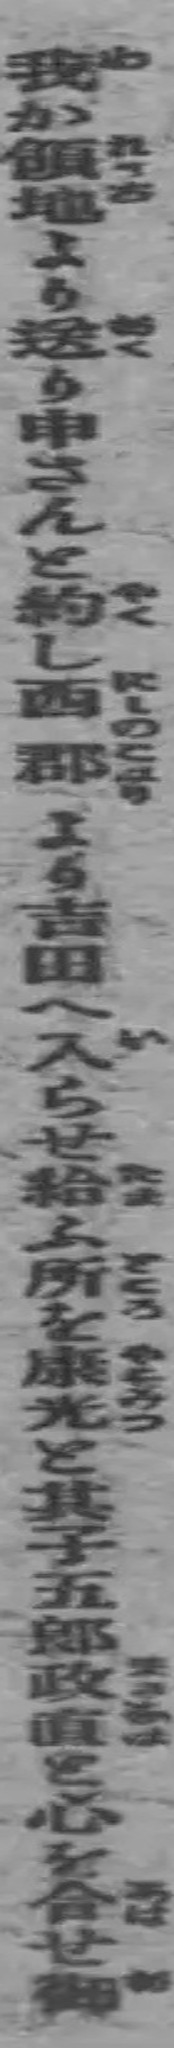我が領地より送り申さんと約し西郡より吉田へ入らせ給ふ所を康光と其子五郎政直と心を合せ御
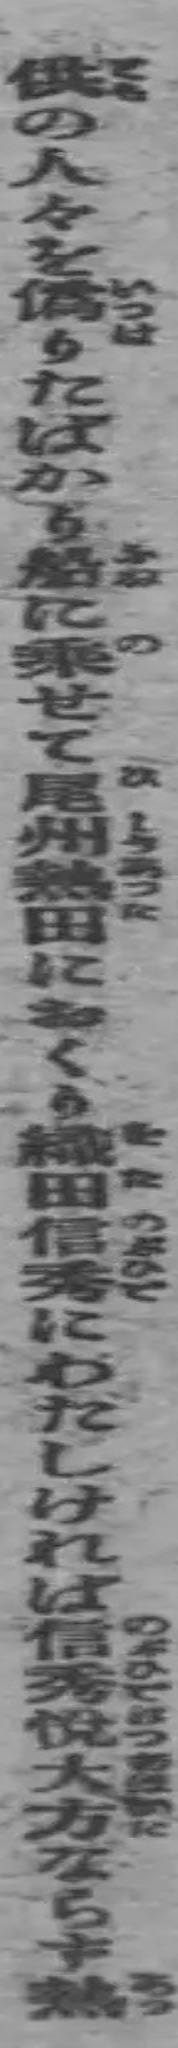供の人々を偽りたばかり船に乗せて尾州熱田におくり織田信秀にわたしければ信秀悦大方ならず熱
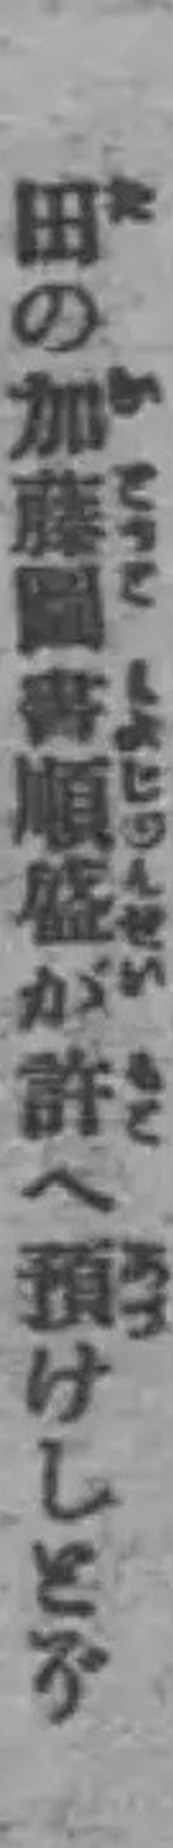田の加藤図書順盛が許へ預けしとぞ
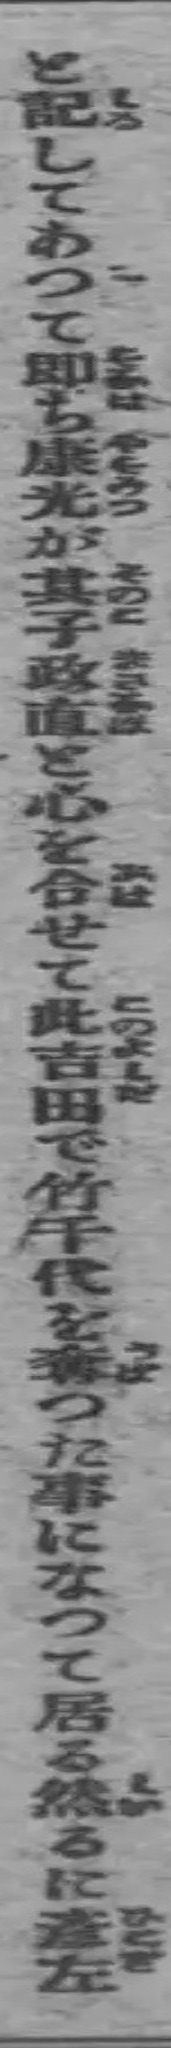と記してあつて即ち康光が其子政直と心を合せて此吉田で竹千代を奪つた事になつて居る然るに彦左
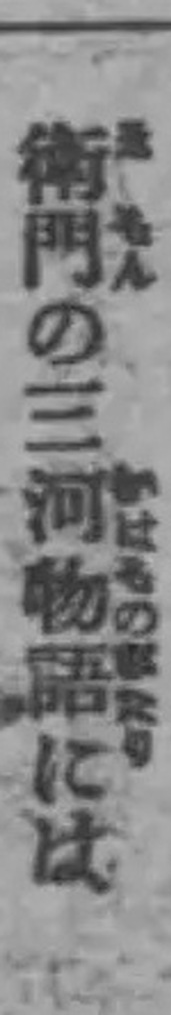衛門の三河物語には
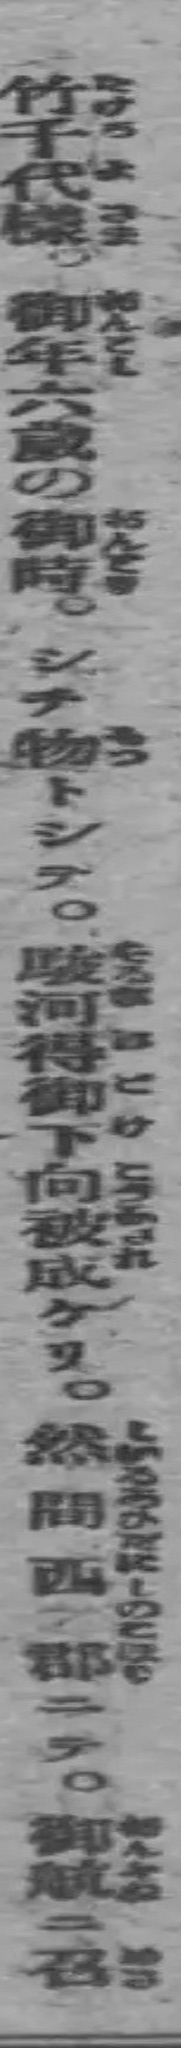竹千代様。御年六歳の御時。シチ物トシテ。駿河得御下向被成ケリ。然間西郡ニテ。御船ニ召
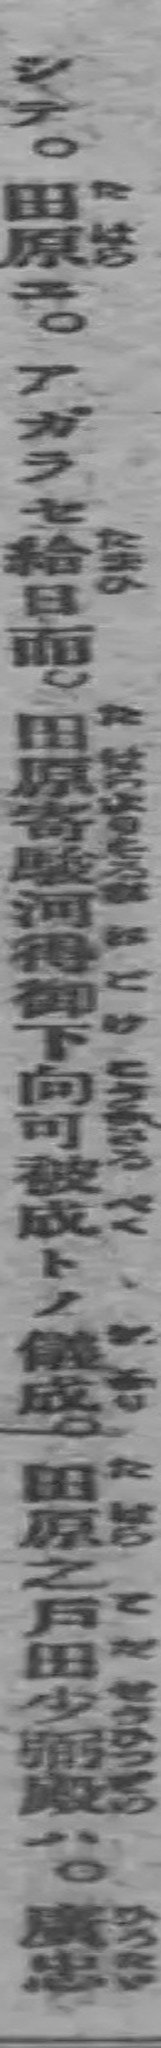シテ。田原エ。アガラセ給日而。田原寄駿河得御下向可被成トノ儀成。田原之戸田弾正少弼殿ハ。広忠
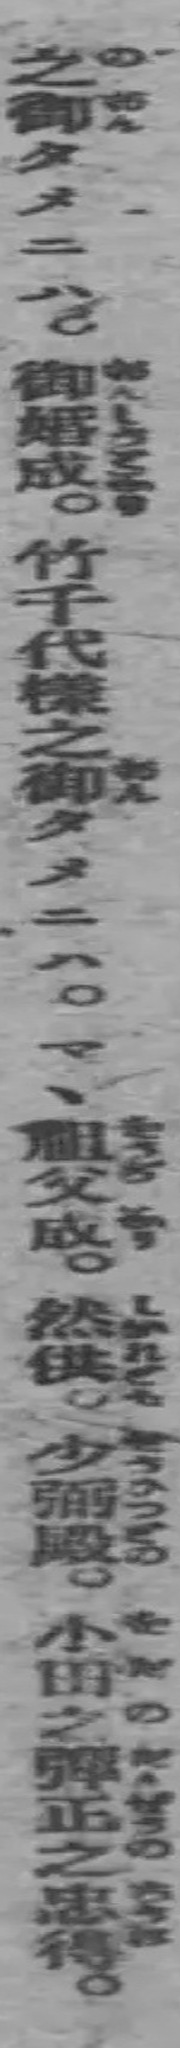之御タメニハ。御婚成。竹千代様之御タメニハ。マヽ祖父成。然供。少弼殿。小田之弾正之忠得。
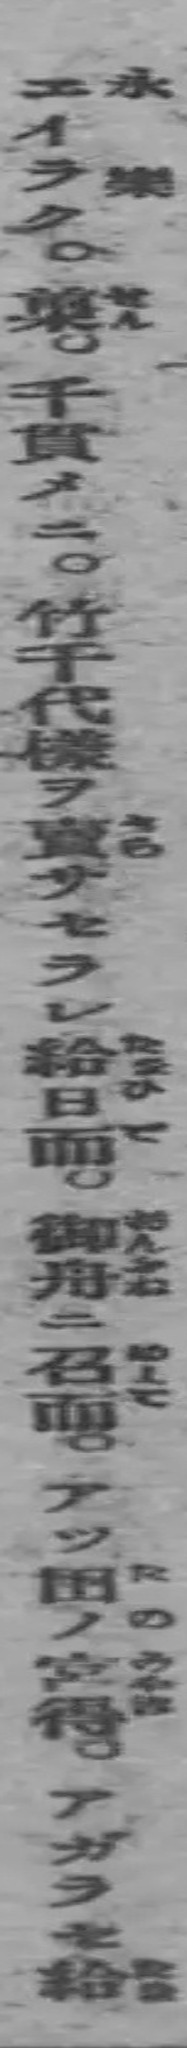エイラク。。千貫メニ。竹千代様ヲ売サセラレ給日而。御舟ニ召而。アツ田ノ宮得。アガラセ給
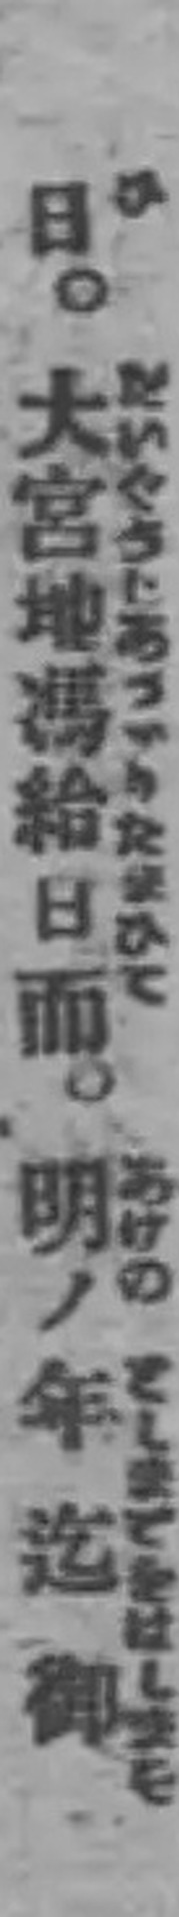日。大宮地馮給日而。明ノ年迄御
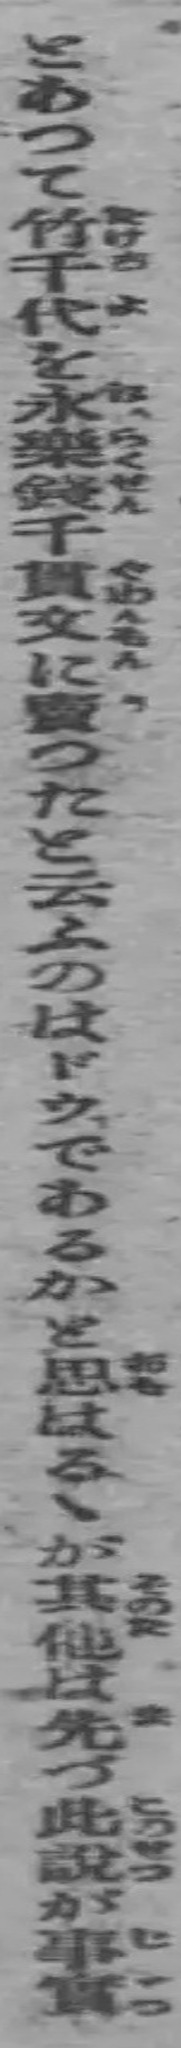とあつて竹千代を永楽銭千貫文に売つたと云ふのはドウであるかと思はるゝが其他は先づ此説が事実
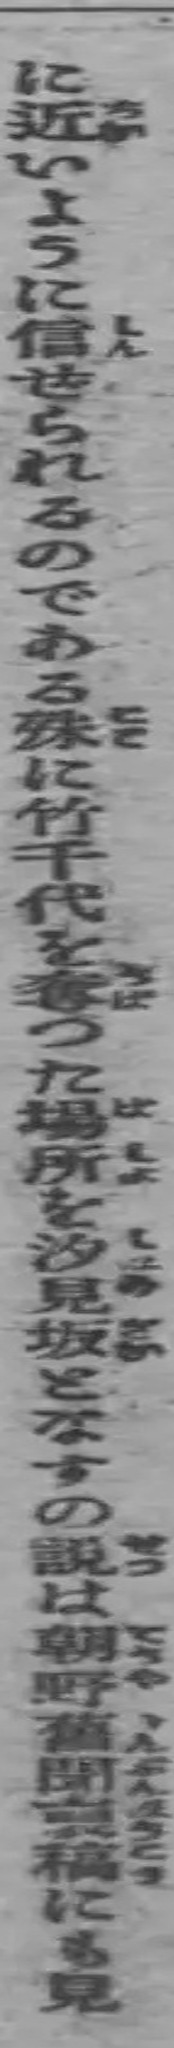に近いように信ぜられるのである殊に竹千代を奪つた場所を汐見坂となすの説は朝野旧聞裒稿にも見
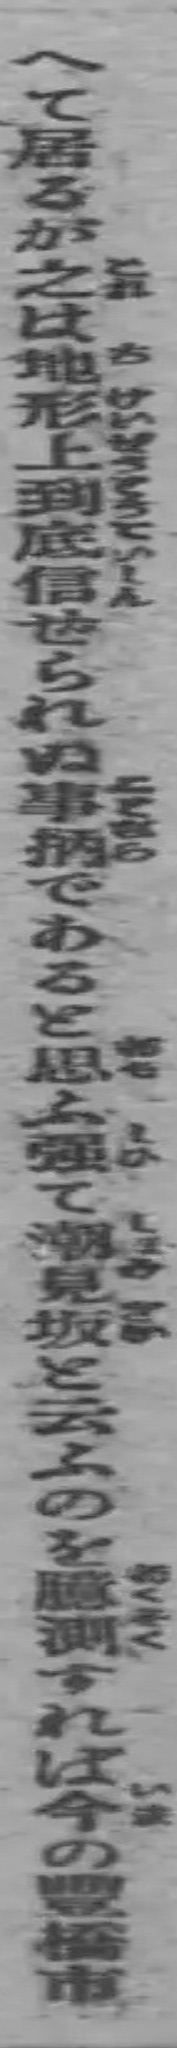へて居るが之は地形上到底信ぜられぬ事抦であると思ふ強て潮見坂と云ふのを臆測すれば今の豊橋市
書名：豊橋市史談
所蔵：国立国会図書館 National Diet Library, JAPAN
